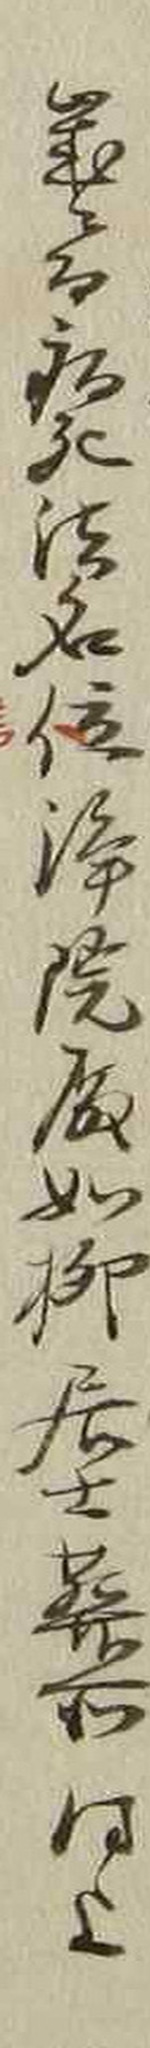歳に而病死法名信浄院殿如柳居士葬所同上
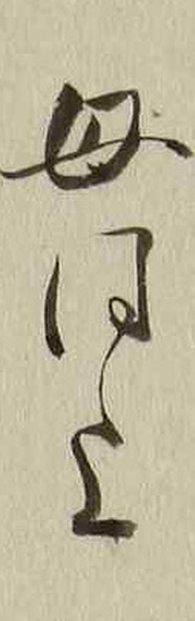母同上
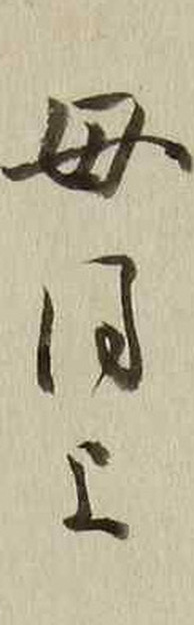母同上
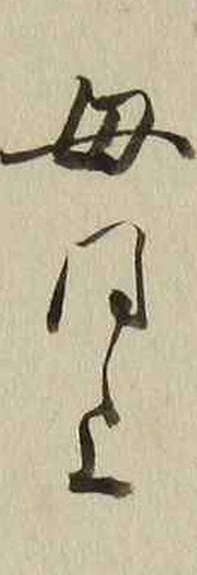母同上
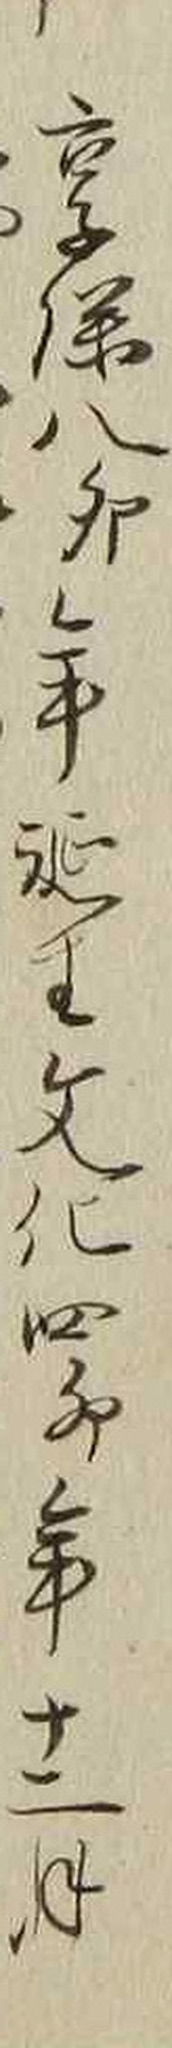享保八卯年誕生文化四卯年十二月
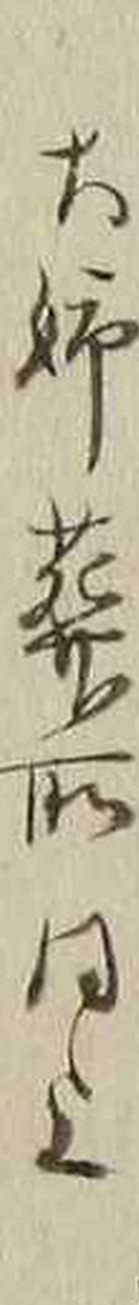大姉葬所同上
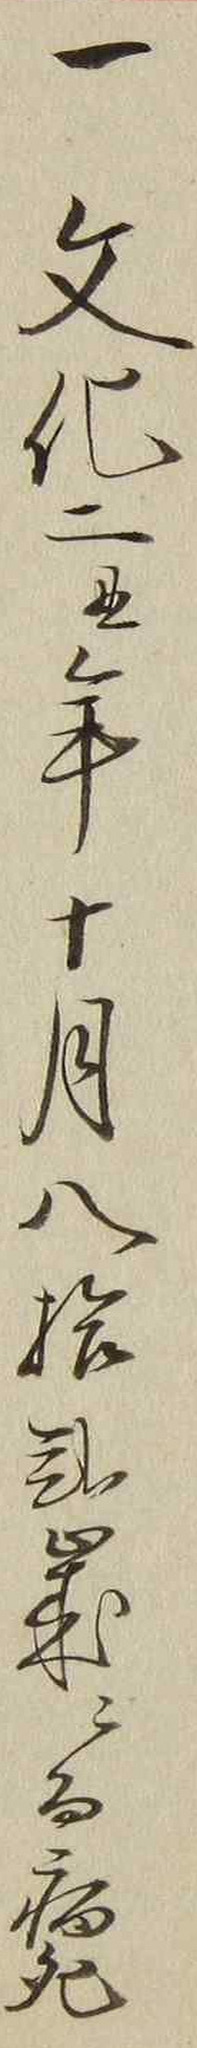一文化二丑年十月八拾弐歳に而病死
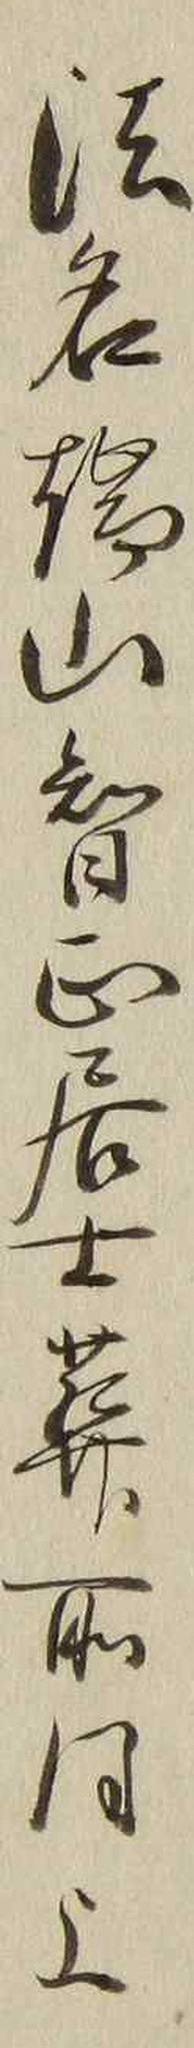法名端山智正居士葬所同上

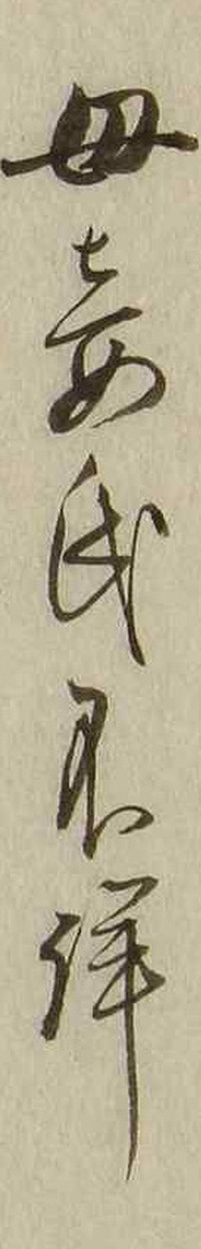母妾氏不詳
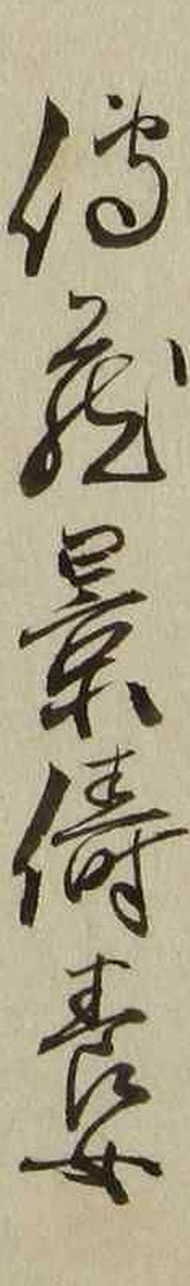伝蔵景儔養女
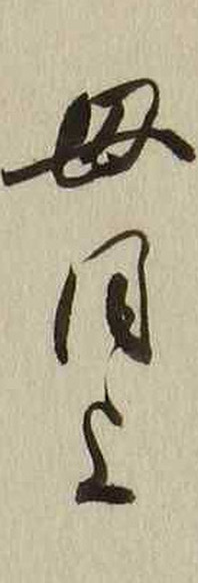母同上
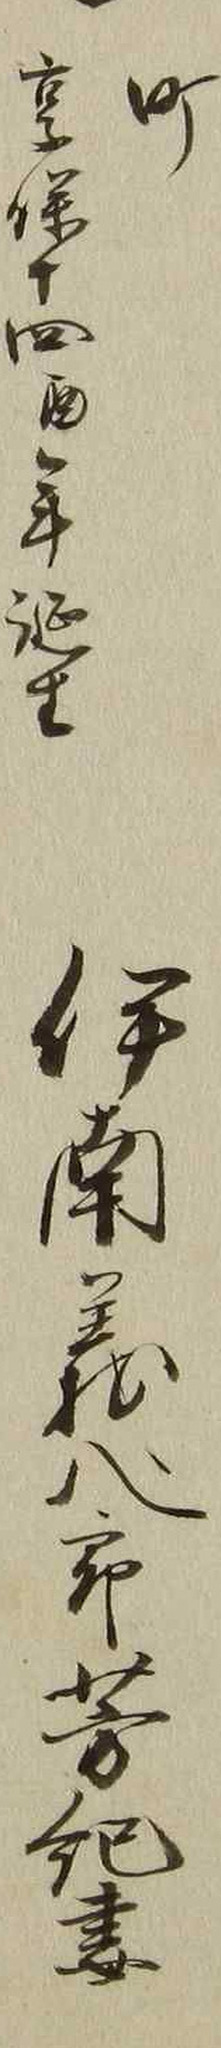女町享保十四酉年誕生伊南義八郎芳紀妻
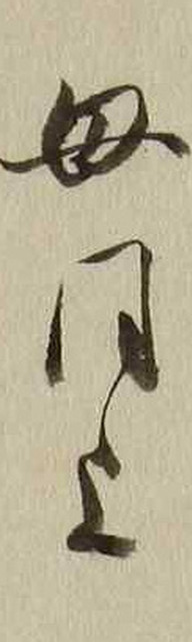母同上
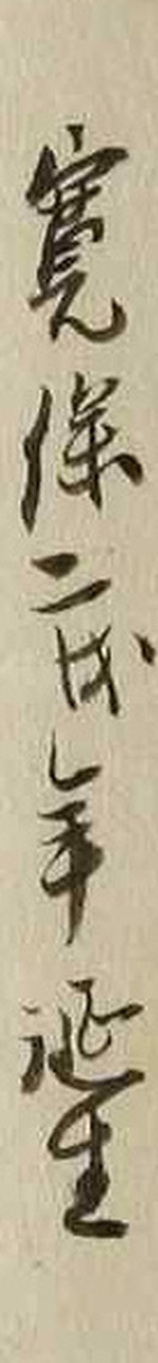寛保二戌年誕生
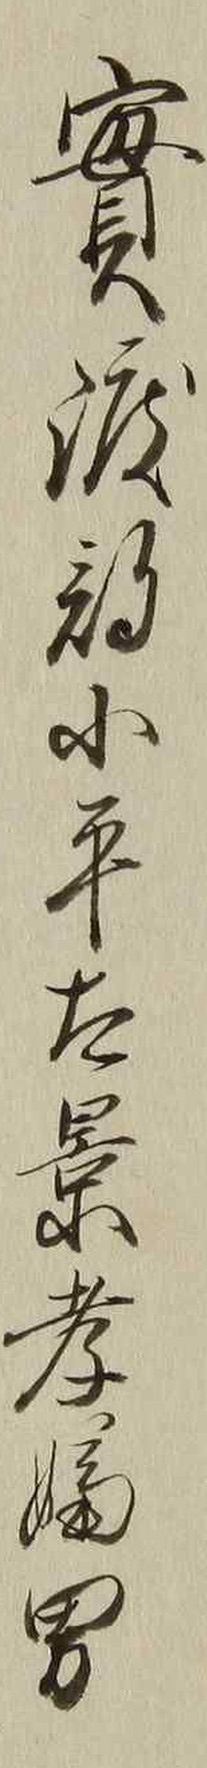実渡部小平太景孝嫡男
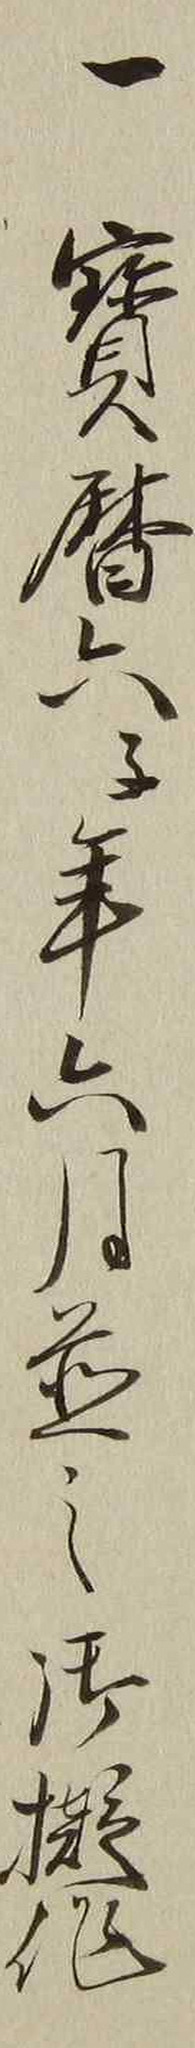一宝暦六子年六月並之御擬作
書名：諸士系譜　巻之103　か之部11
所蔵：会津若松市立会津図書館
